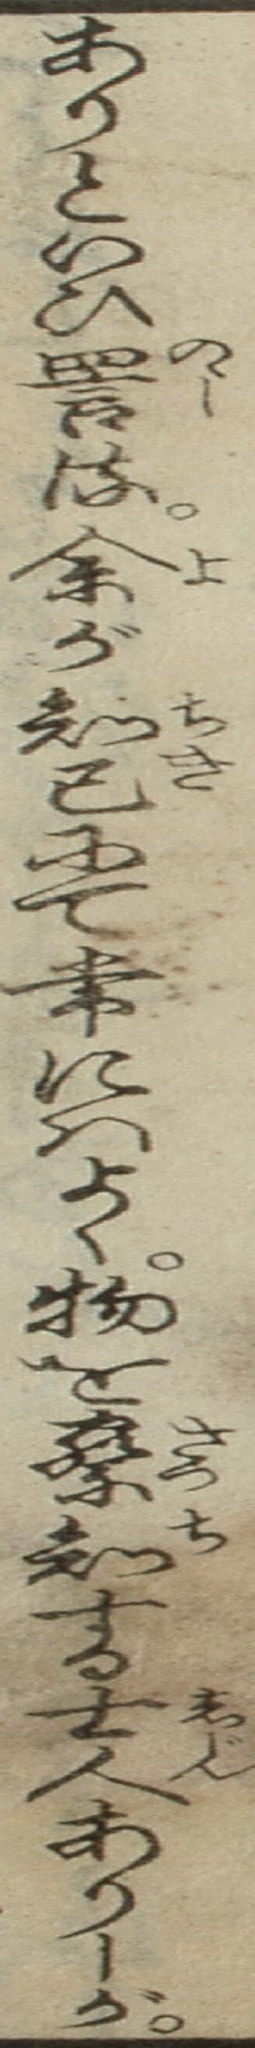ありといひ詈る。余が知己にて常にはよく。物を察知する士人ありしが。
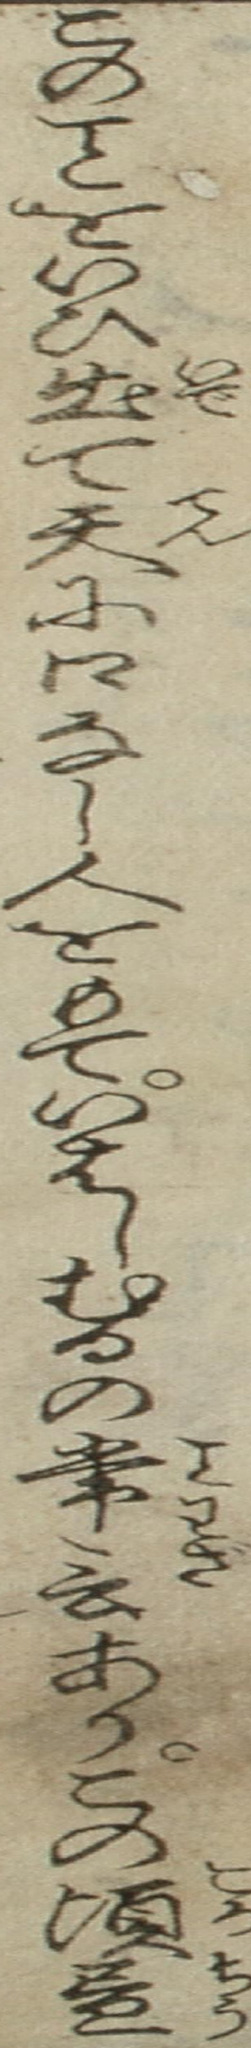このことをいひ出て天に口なし人をもて。いはしむるの常言あり。この頃昼
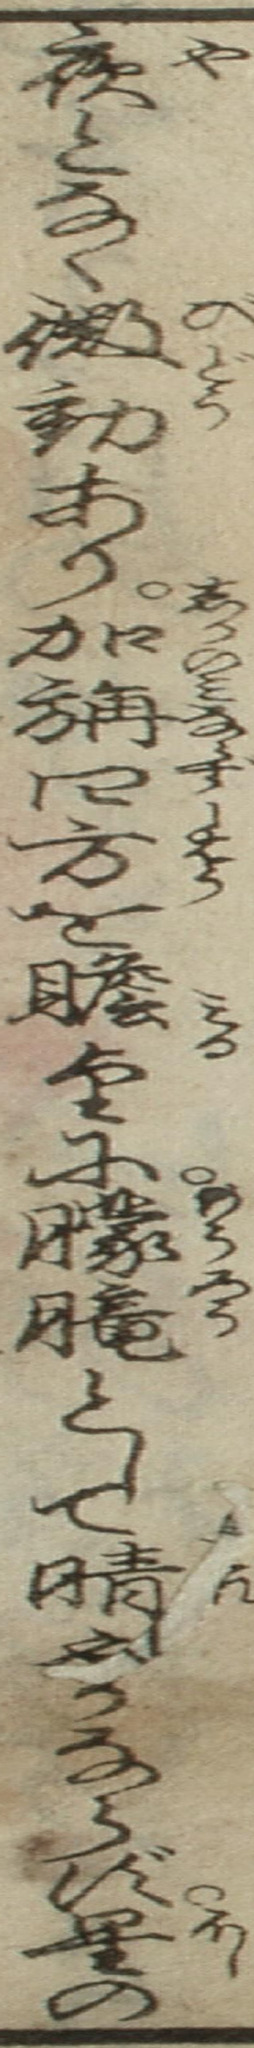夜となく微動あり。加旃四方を瞻望に。朦朧として晴やかならず。星の
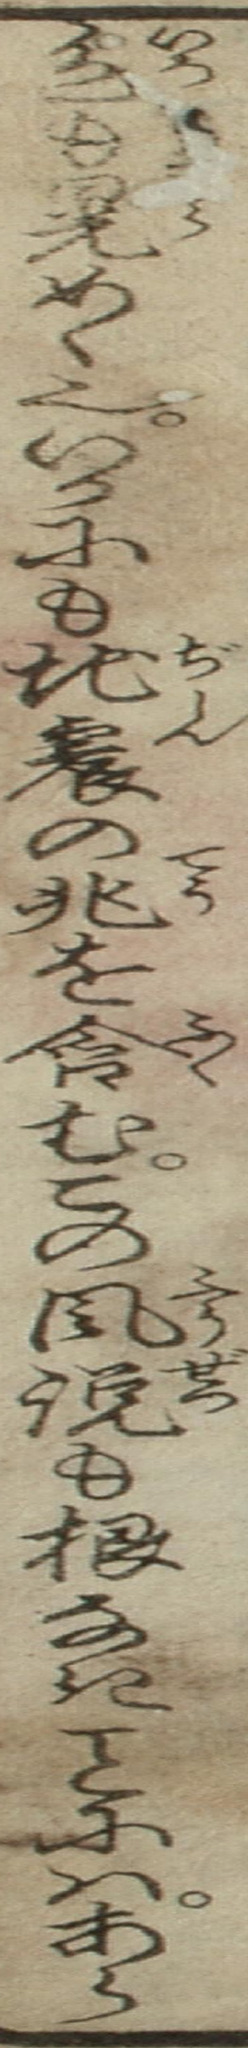色も晃めく也。いかにも地震の兆を含む。この風説も根なきことには。あら

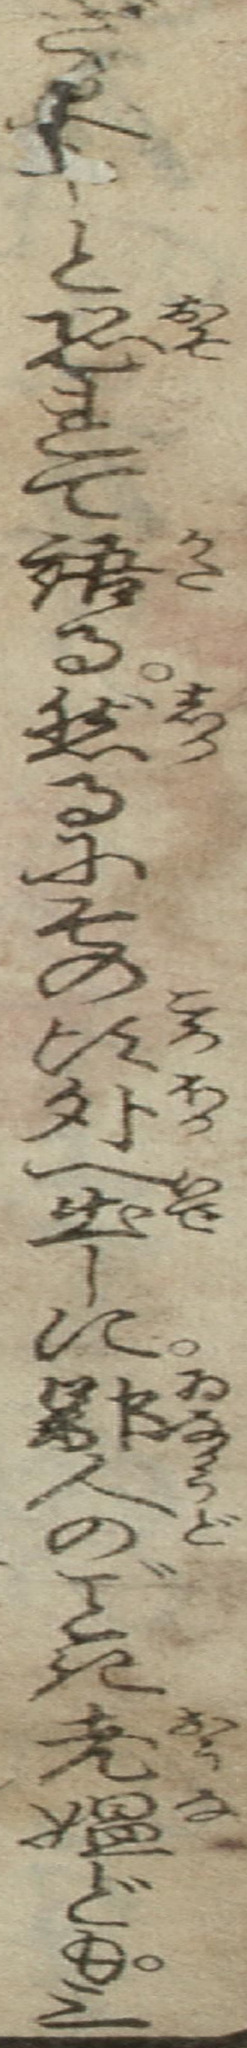ざる『べし』と恐れて語る。然るにその頃外へ出しに。鄙人のごとき老媼ども。三
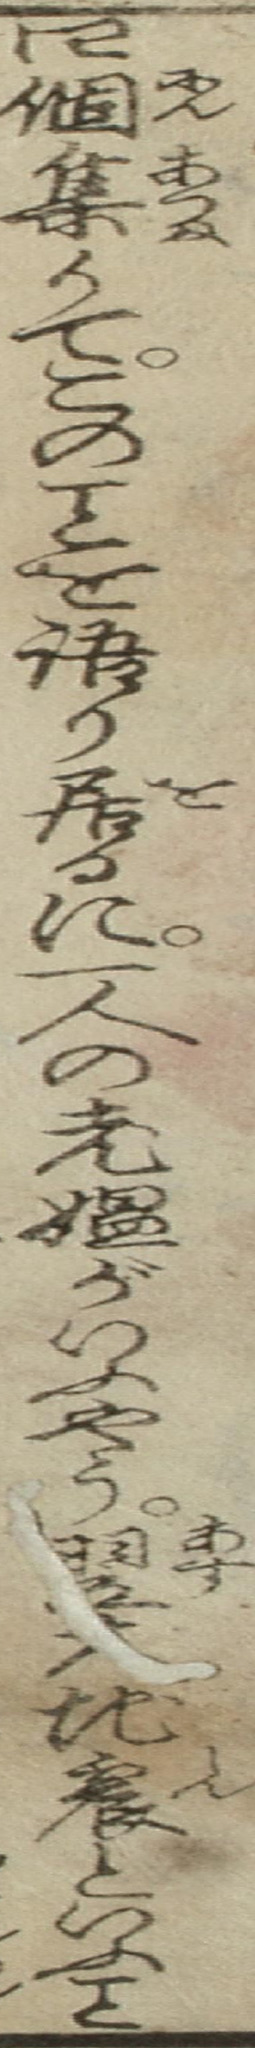四個集りて。このことを語り居るに。一人の老媼がいふやう。翌大地震といふこと
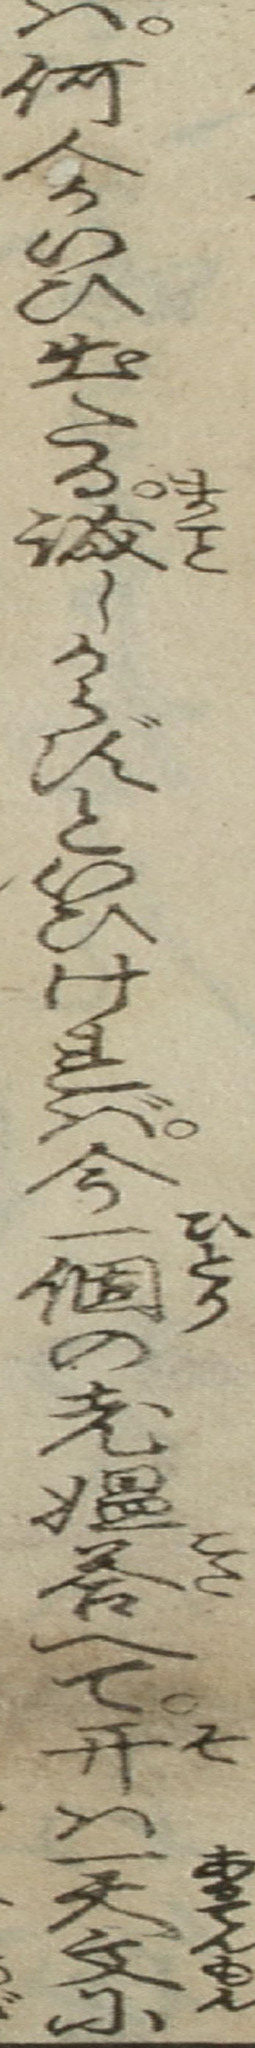は。何人がいひ出たる。誠しからずといひければ。今一個の老媼答へて。其は一天文に
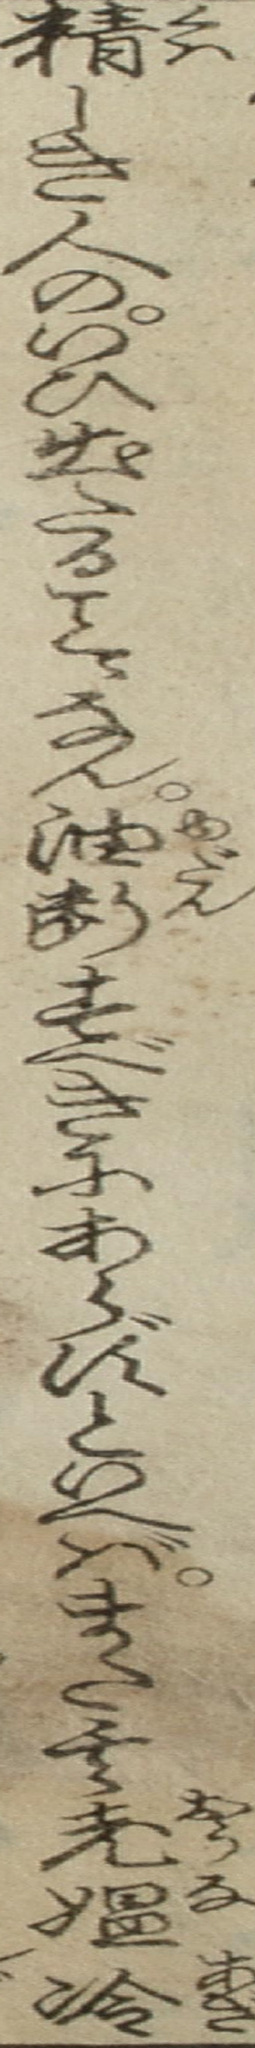精しき人の。いひ出たることゝなん。油断すべきにあらずといへば。また其老媼冷
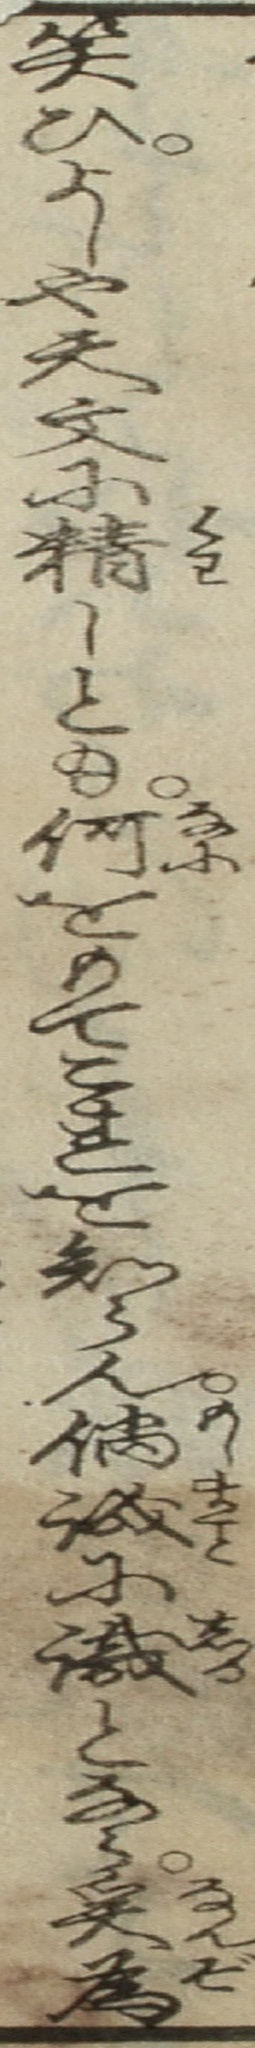笑ひ。よしや天文に精しとも。何をもてこれを知らん。倘誠に識となら。奚為
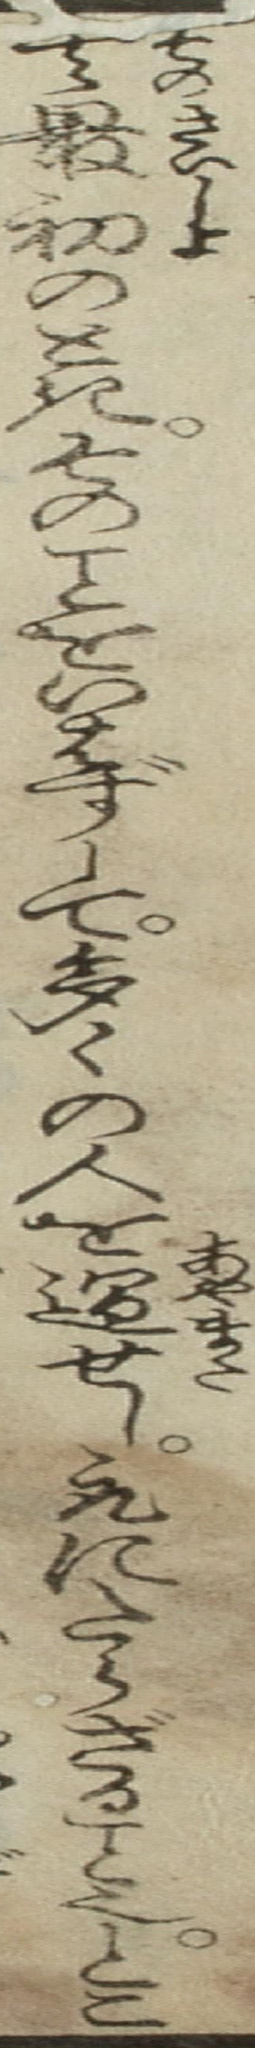其最初のとき。そのことをいはずして。多くの人を過せし。取にたらざること也。とこ
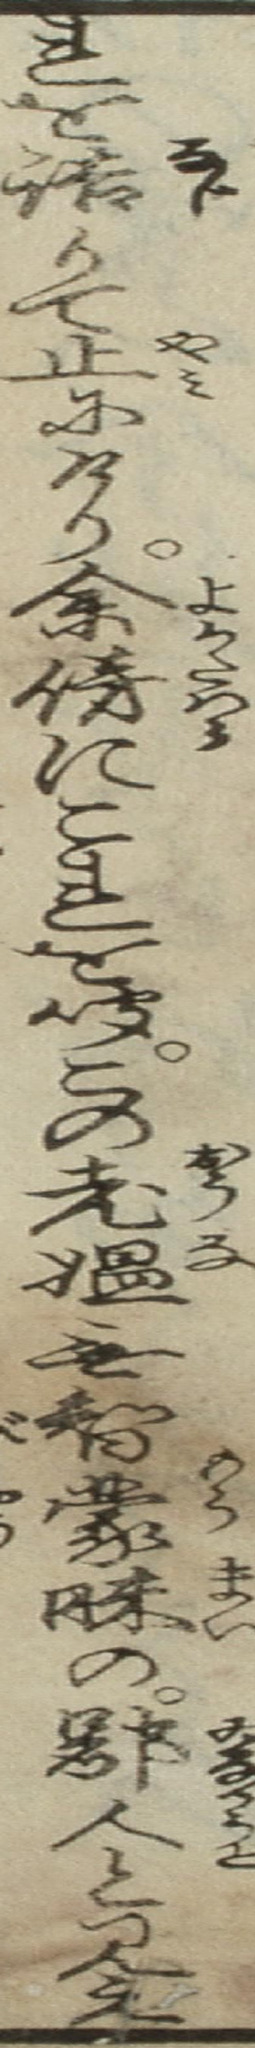れを詰りて止にけり。余傍にこれを聞。この老媼無智蒙昧の。鄙人と見え
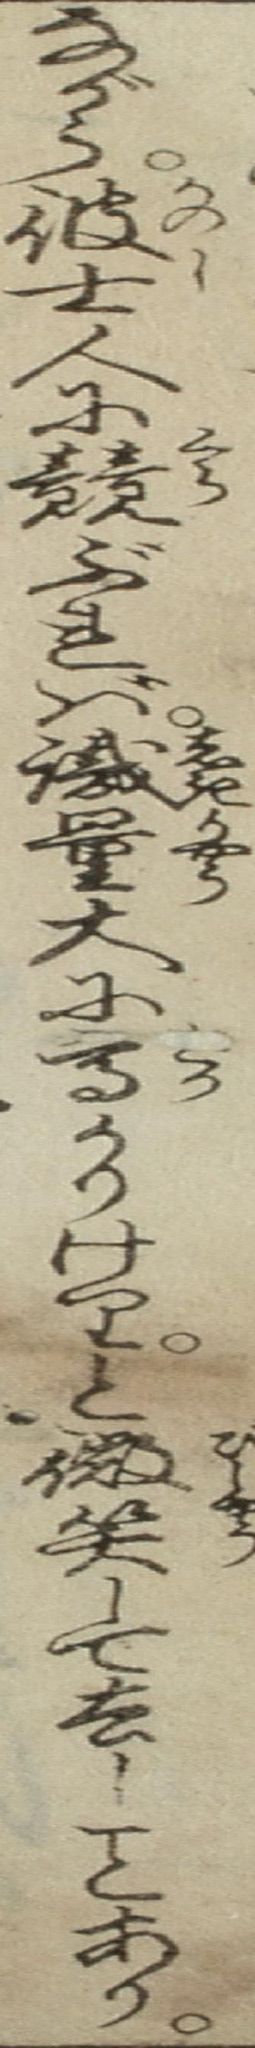ながら。彼士人に競ぶれば。識量大に高かりけり。と微笑して去しことあり。
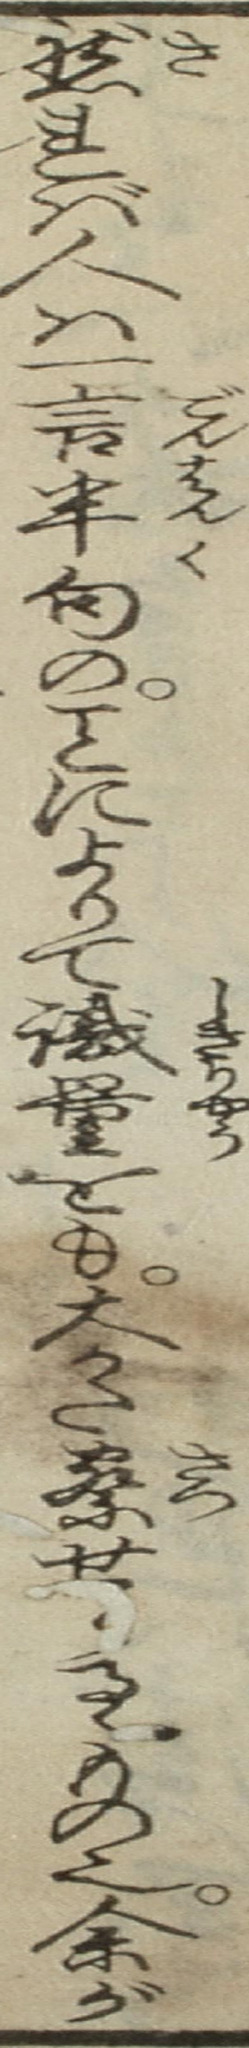然れば人は一言半句の。ことによりて識量をも。大かた察せらるゝもの也。余が
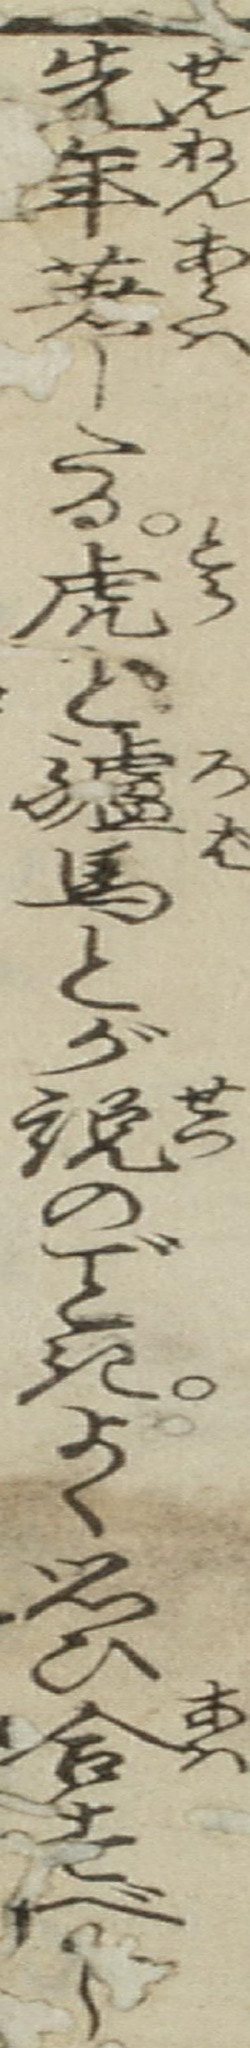先年著したる。虎と驢馬とが説のごとき。よく思ひ合すべし
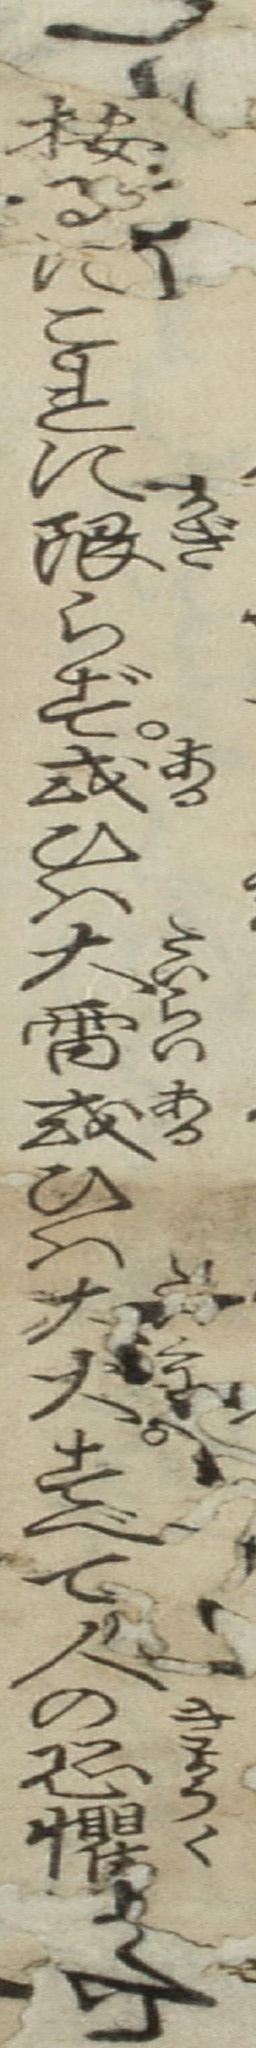按るにこれに限らず。或ひは大雷或ひは大火。すべて人の恐懼する
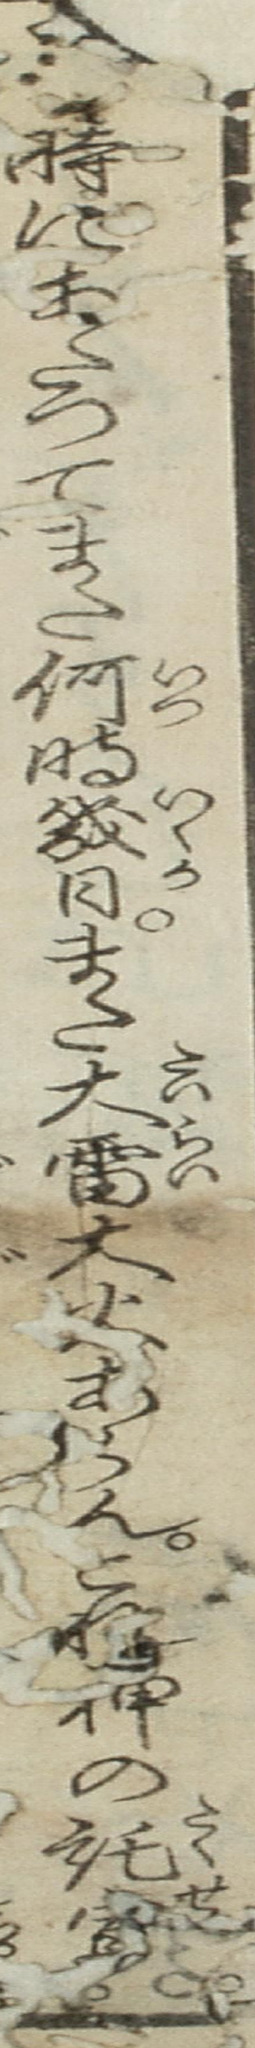時にあたつてまた何時幾日。また大雷大火あらん。これ神の託宣。
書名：安政見聞録　中
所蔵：東京大学地震研究所図書室 Earthquake Research Institute Library, The University of Tokyo, JAPAN
